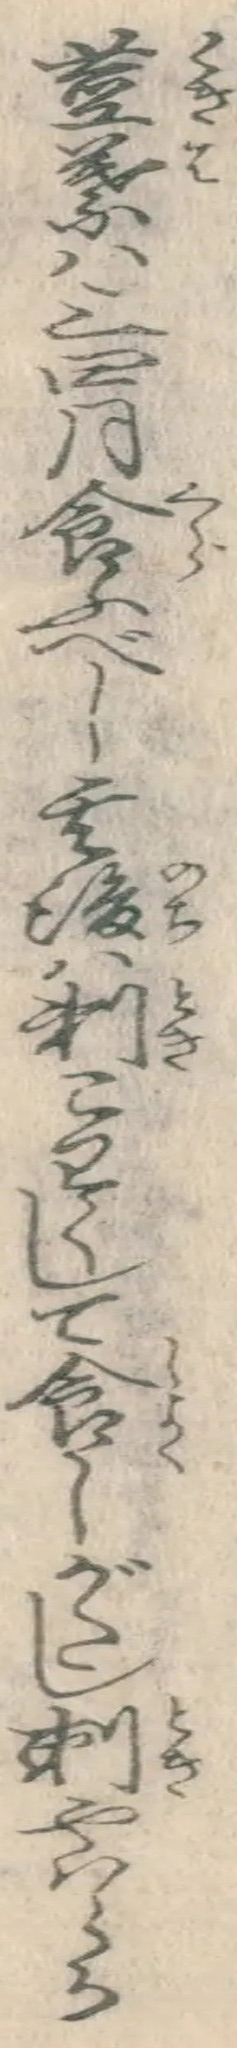茎葉は三四月食ふべし其後は刺こわくして食しがたし刺やはらか
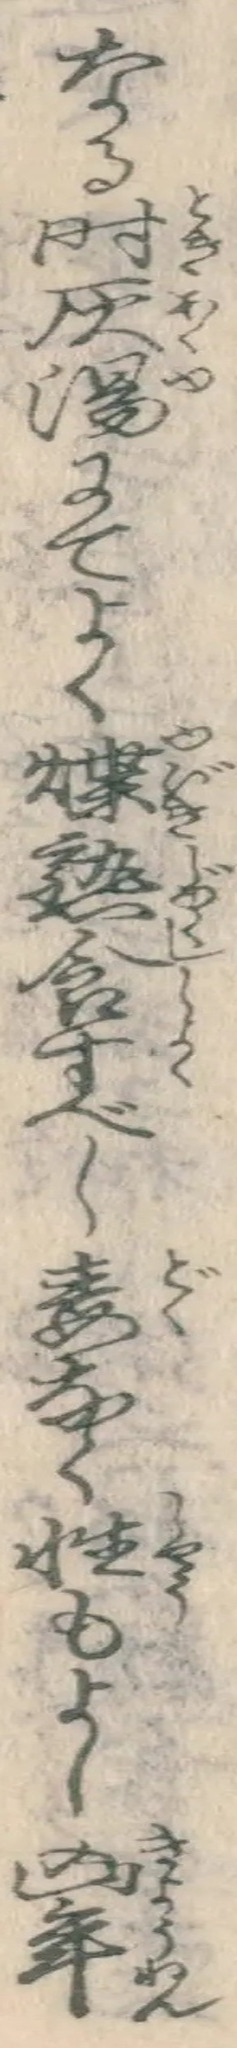なる時灰湯にてよく煠熟食すべし毒なく性もよし凶年
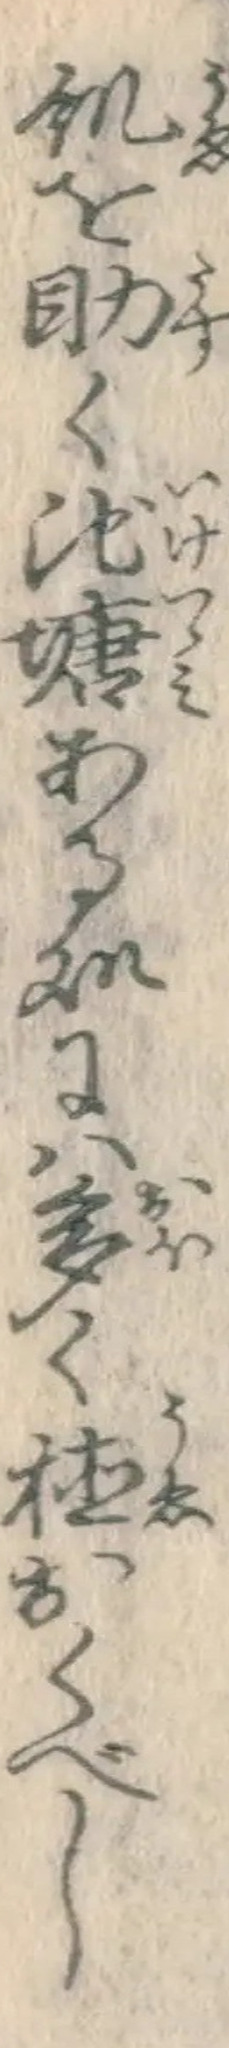飢を助く池塘ある処には多く植おくべし
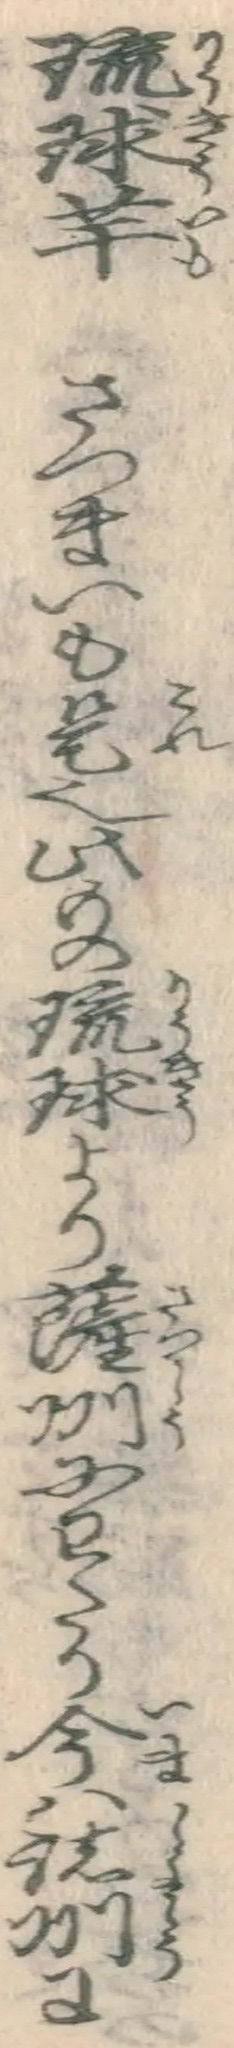琉球芋さつまいも是也此もの琉球より薩州にわたり今は諸州に
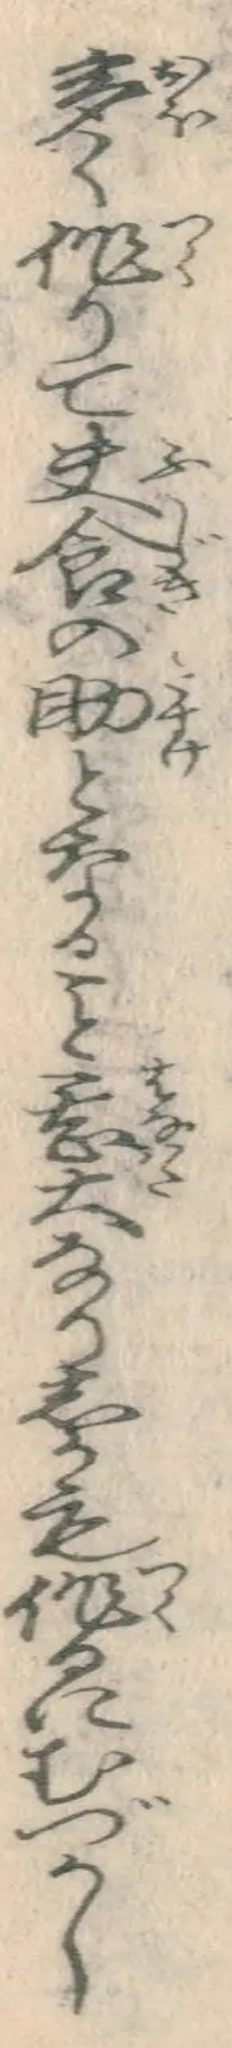多く作りて夫食の助となること甚大なりしかも作るにむづかし
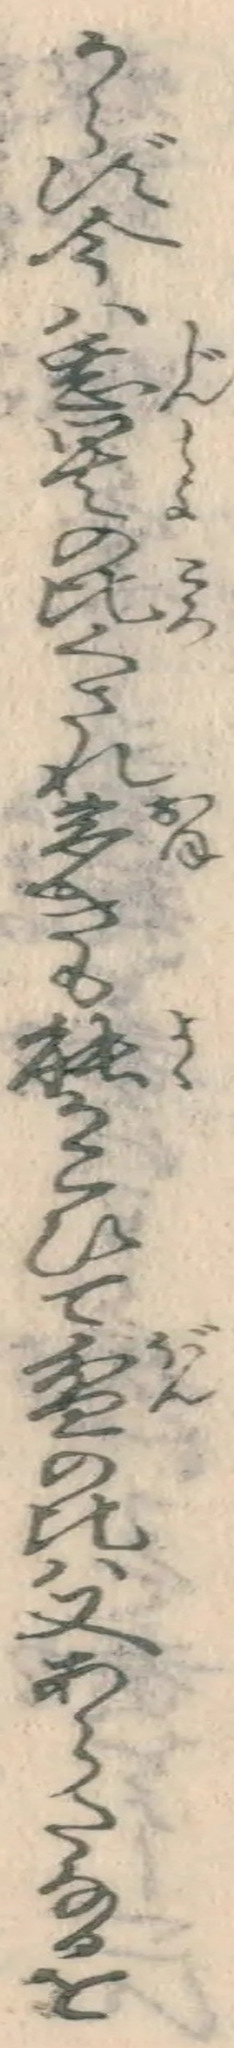からず今は甚暑の比くされ多きも能かこひて盆の比は又あらたなるを
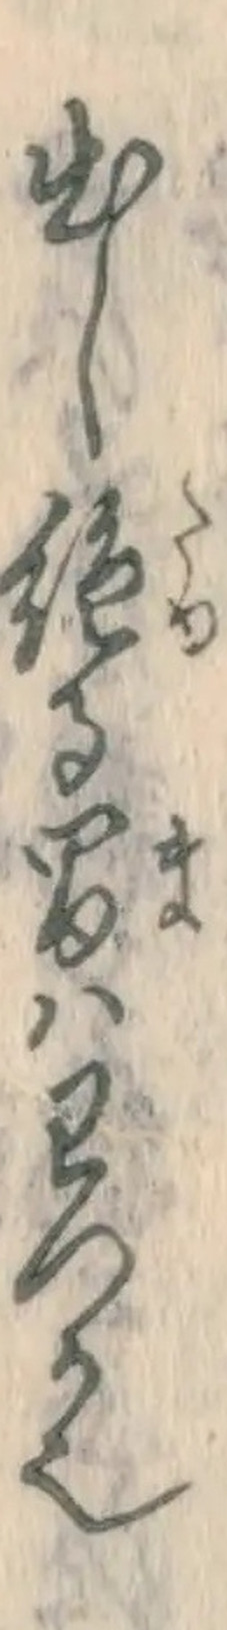出し絶る間はわつか也
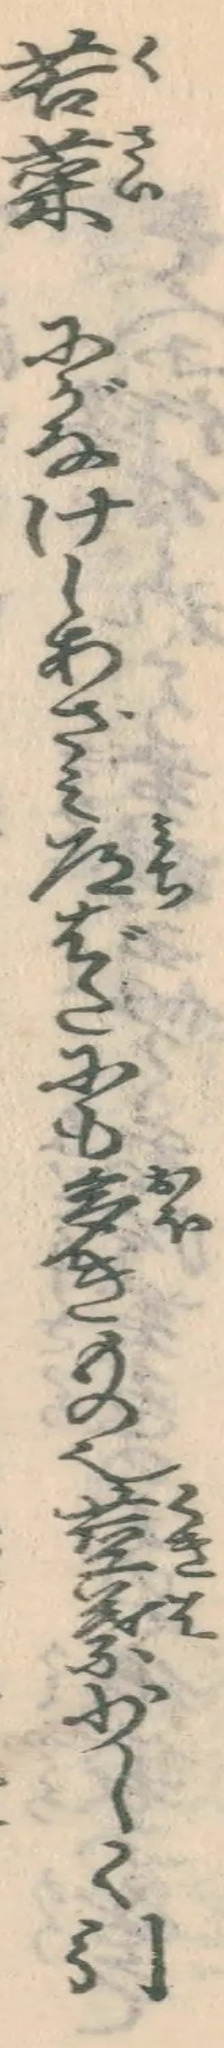苦菜にがなけしあざみ道ばたにも多きもの也茎葉少しく引
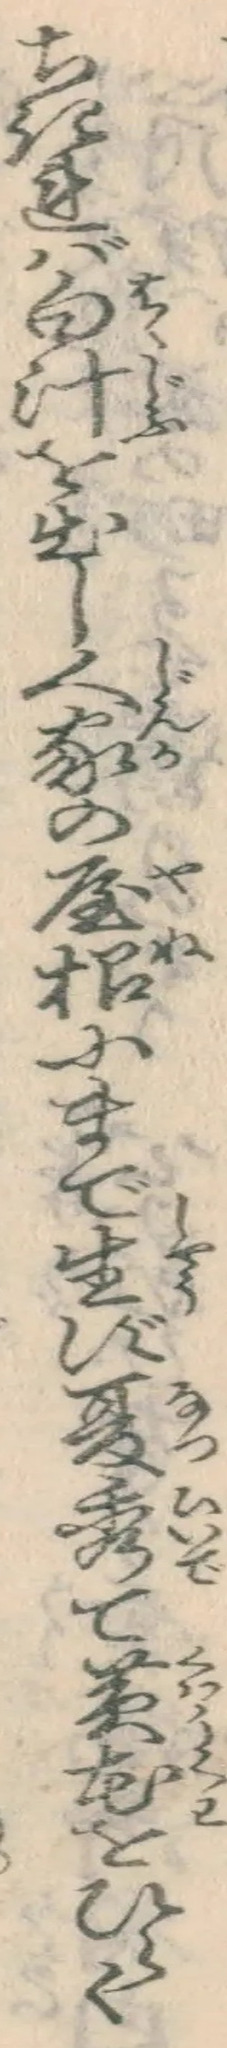ちきれば白汁を出し人家の屋根にまで生ず夏秀て黄花をひらく
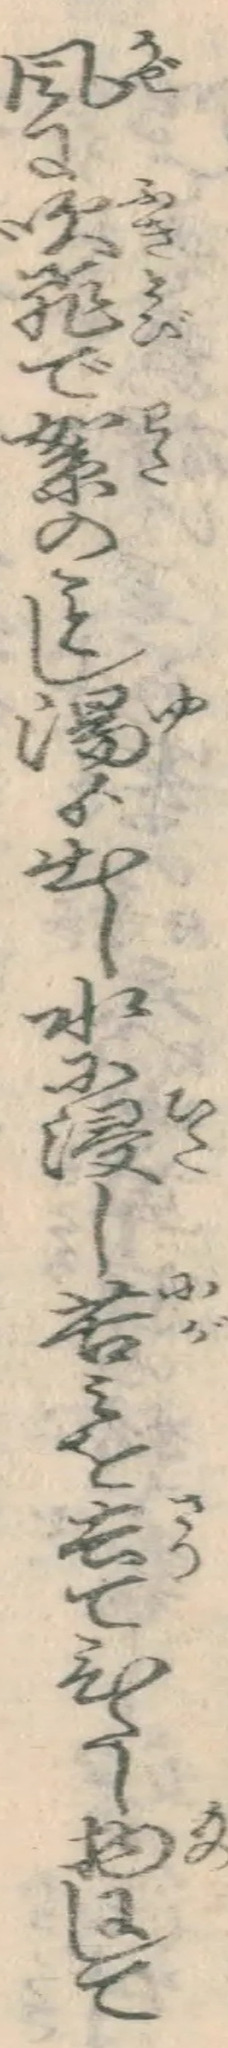風に吹飛で絮のことし湯より出し水に浸し苦みを去てひたし物にして
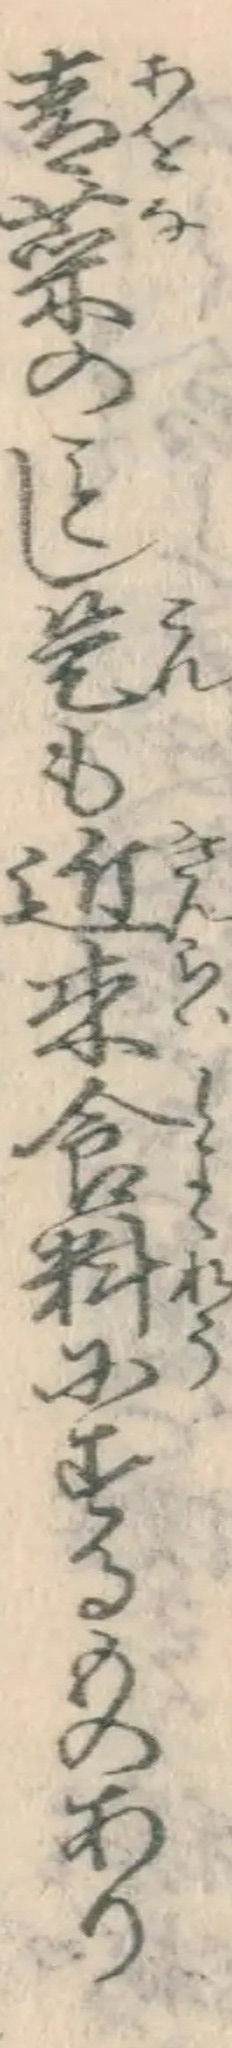青菜のことし是も近来食料にするものあり
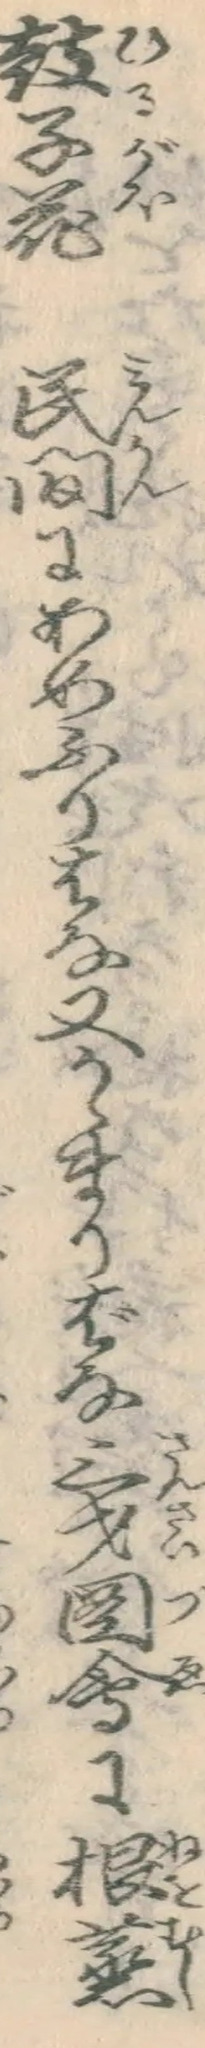鼓子花民間にあめふりはな又からまりばな三才図会に根蒸
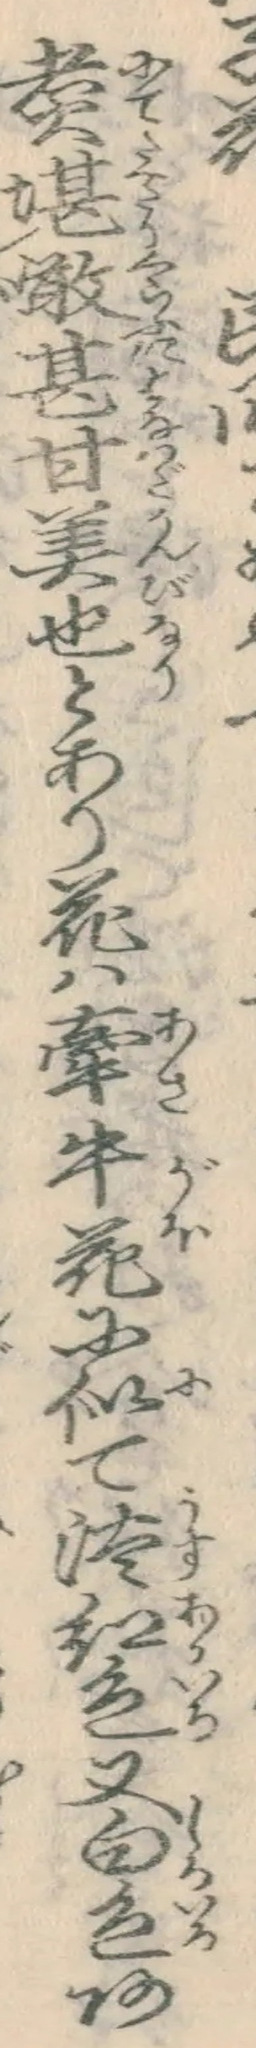煑堪噉甚甘美也とあり花は牽牛花に似て淡紅色又白色あ
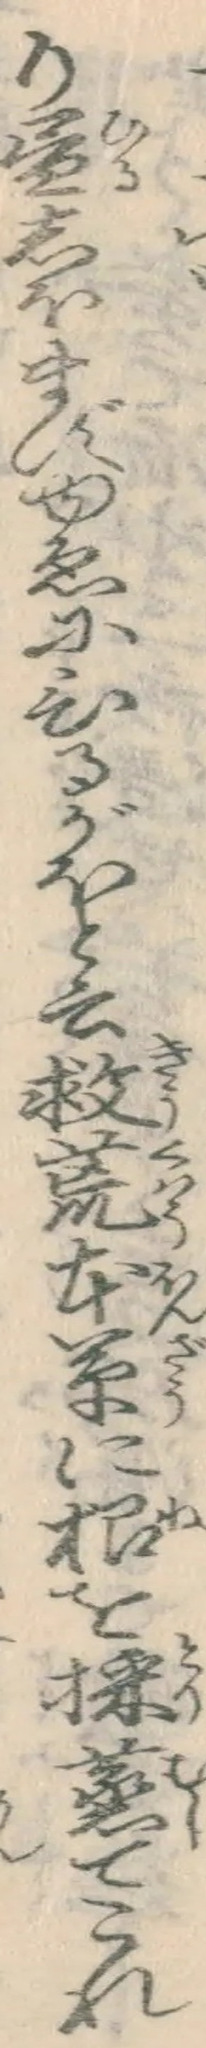り昼しほまずゆゑにひるがほと云救荒本草に根を採蒸てこれ
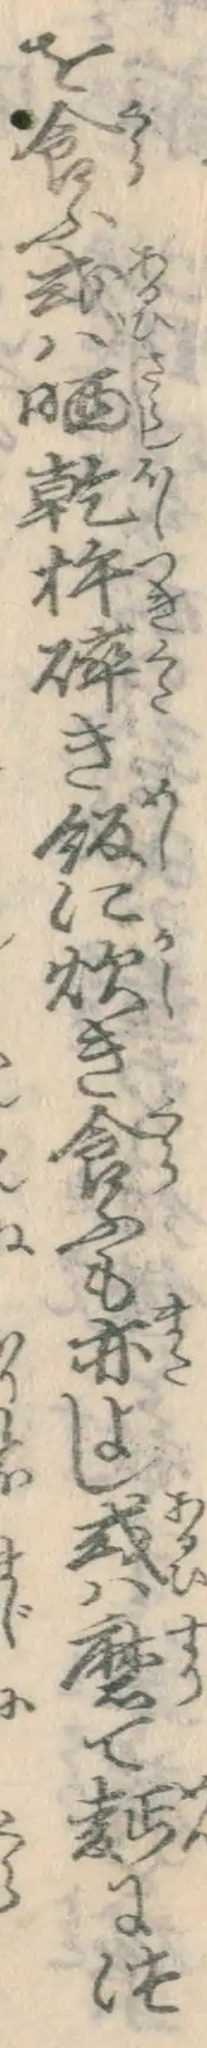を食ふ或は晒乾杵砕き飯に炊き食ふも亦よし或は磨て麺につ
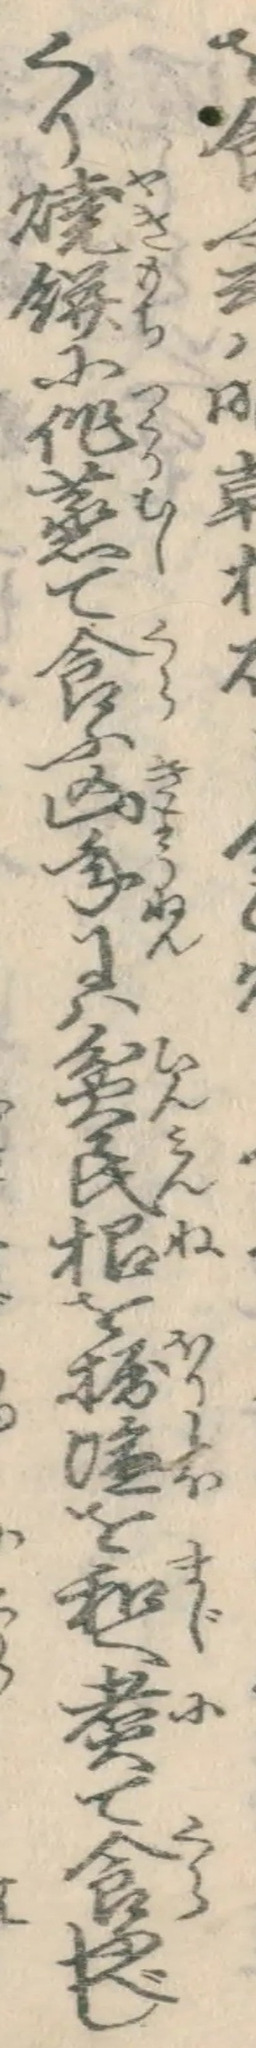くり焼餅に作蒸て食ふ凶年には貧民根を掘塩を和へ煑て食ふべし
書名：経済をしへ草
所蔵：国立国会図書館 National Diet Library, JAPAN
